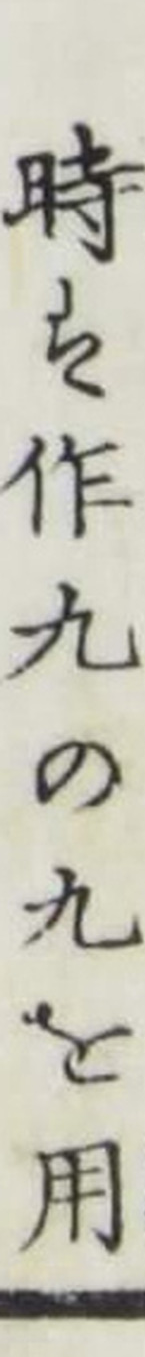時は作九の九を用
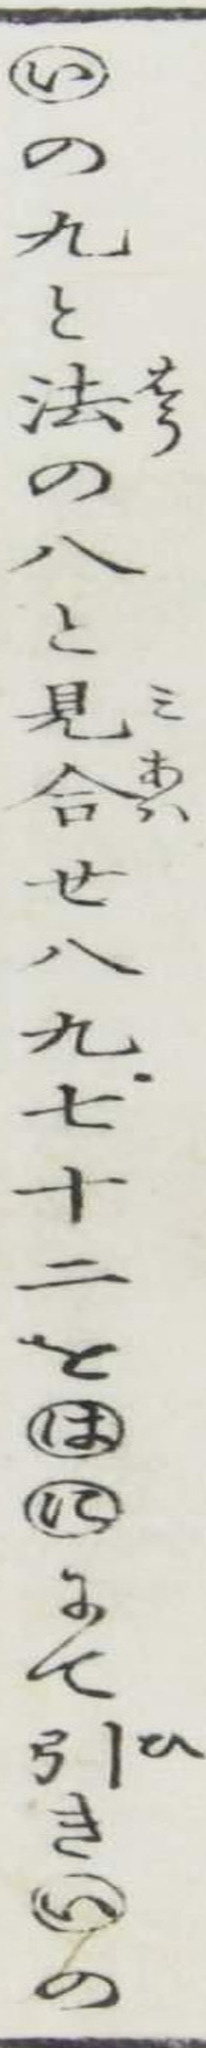㋑の九と法の八と見合せ八九．七十二を㋩㋥にて引き㋑の
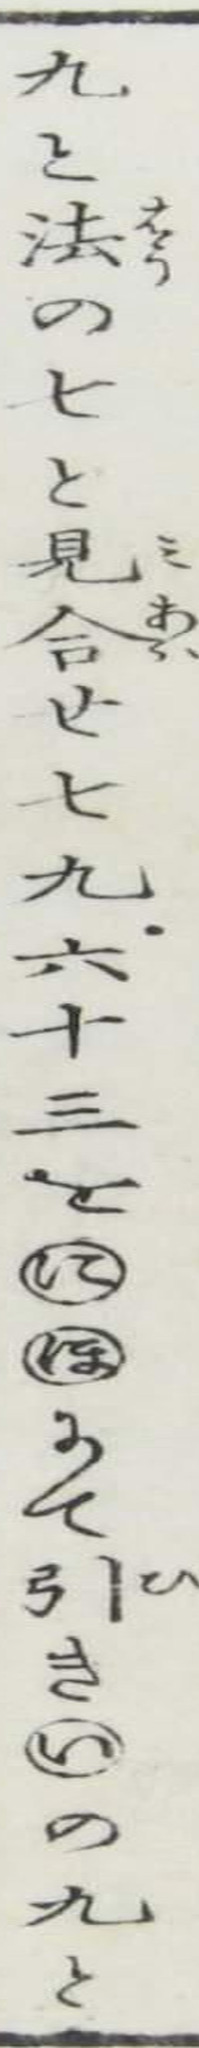九と法の七と見合せ七九．六十三を㋥㋭にて引き㋑の九と
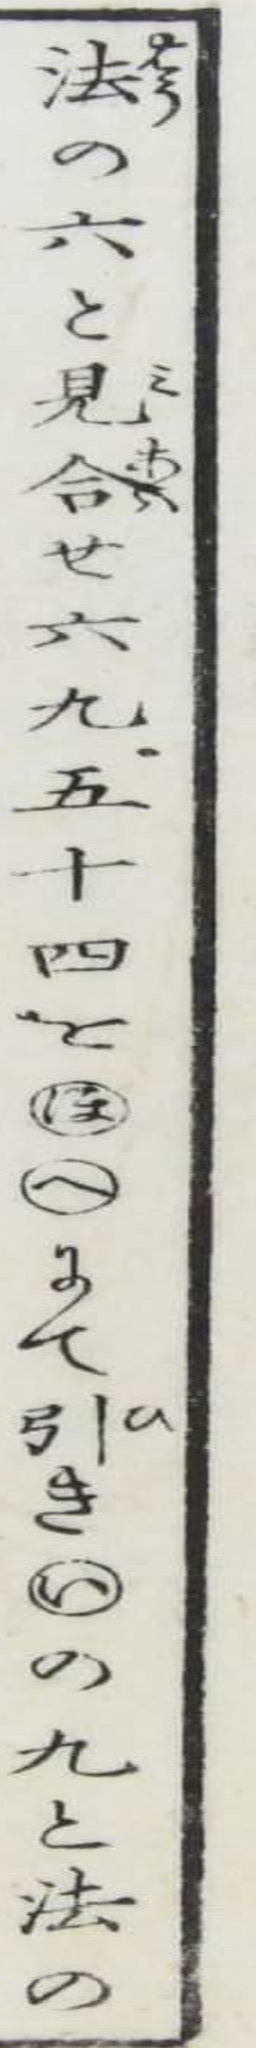法の六と見合せ六九．五十四を㋭㋬にて引き㋑の九と法の
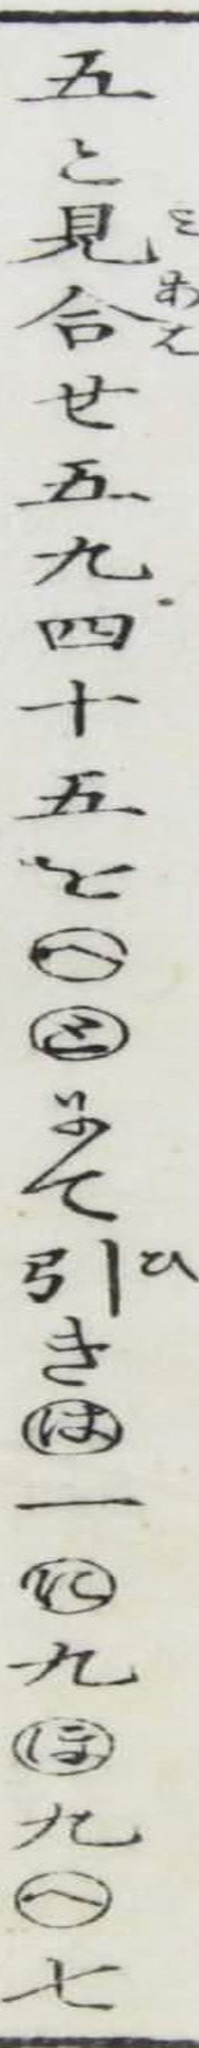五と見合せ五九．四十五を㋬㋣にて引き㋩一㋥九㋭九㋬七
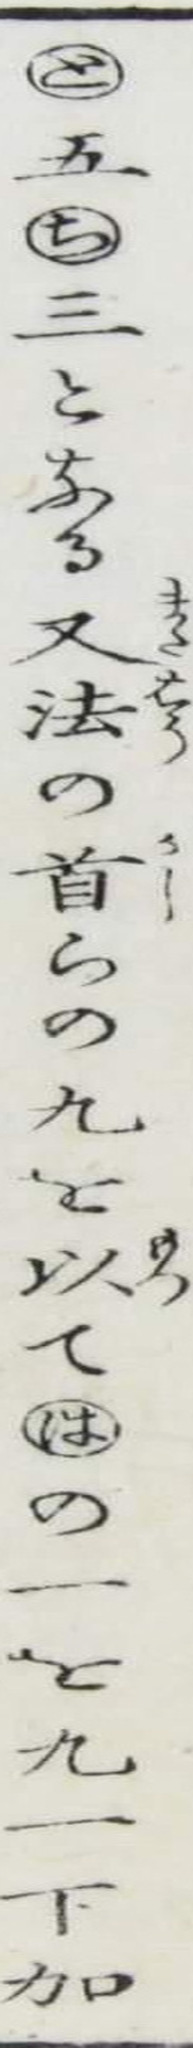㋣五㋠三となる又法の首らの九を以て㋩の一を九一下加
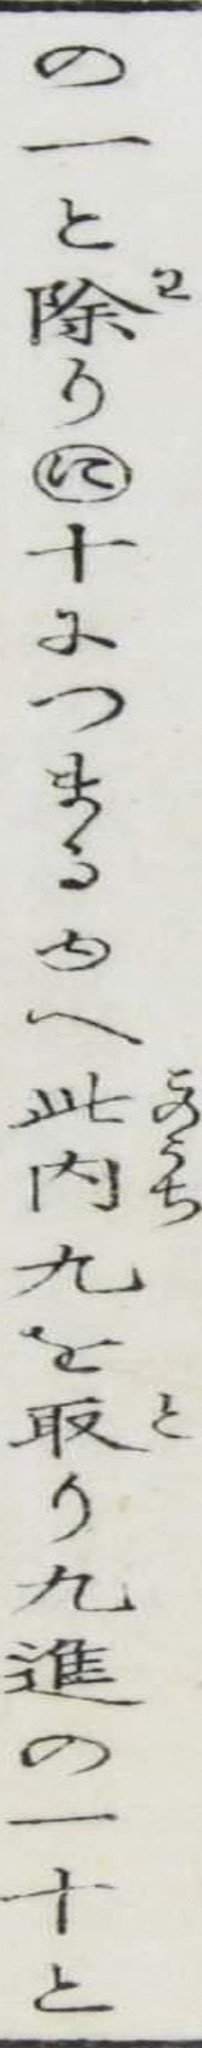の一と除り㋥十につまるゆへ此内九を取り九進の一十と
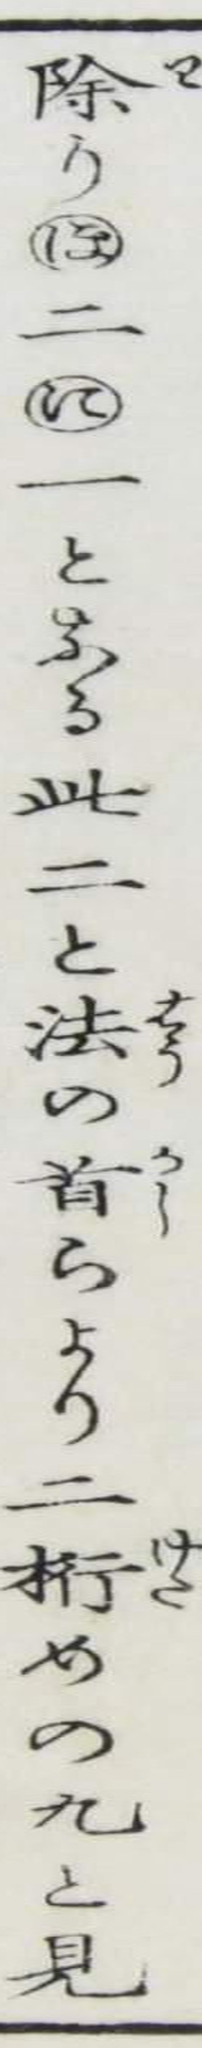除り㋭二㋥一となる此二と法の首らより二桁めの九と見
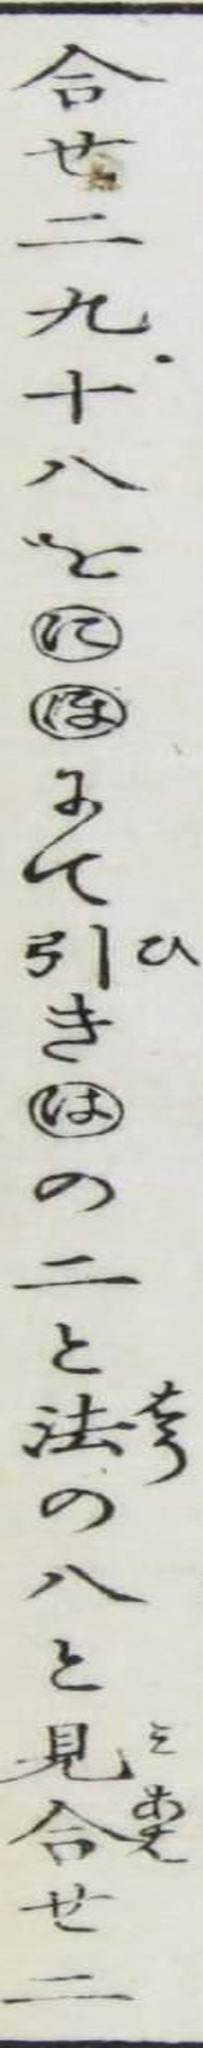合せ二九．十八を㋥㋭にて引き㋩の二と法の八と見合せ二
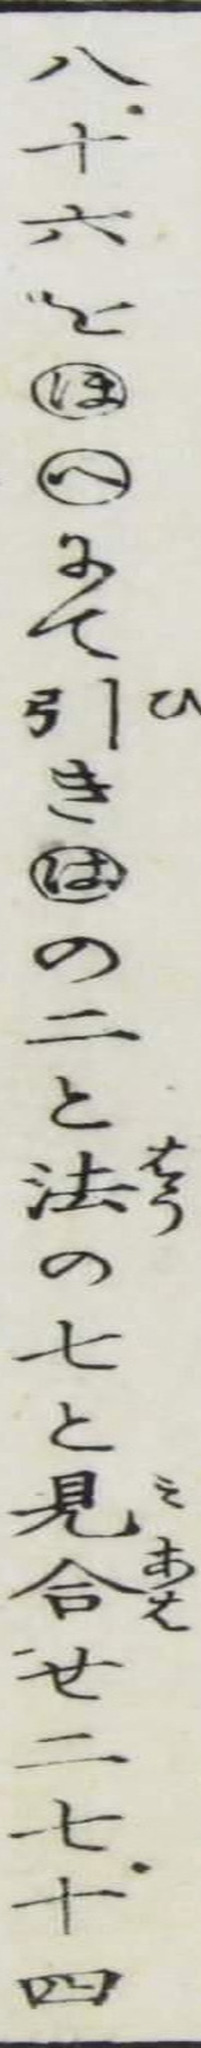八．十六を㋭㋬にて引き㋩の二と法の七と見合せ二七．十四
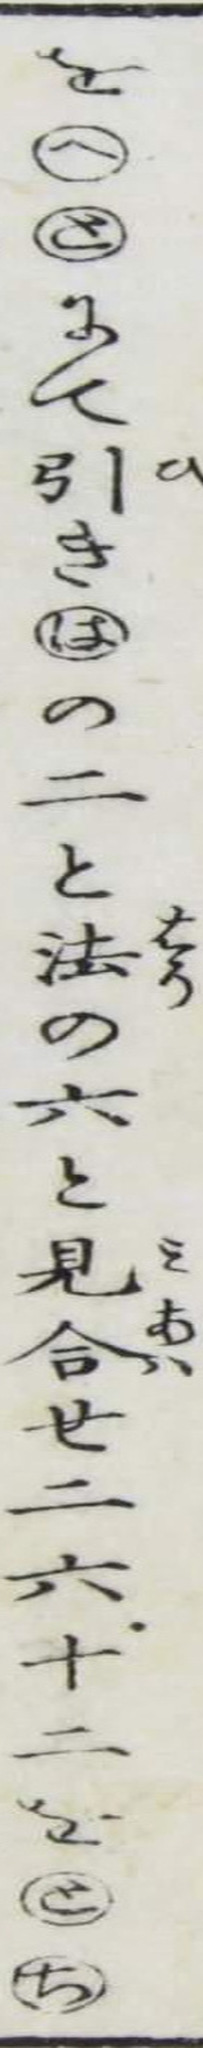を㋬㋣にて引き㋩の二と法の六と見合せ二六．十二を㋣㋠
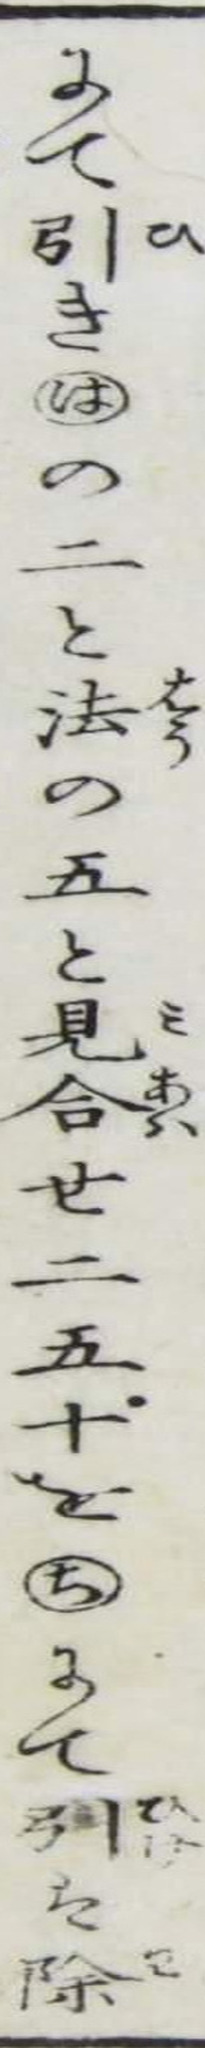にて引き㋩の二と法の五と見合せ二五．十を㋠にて引は除
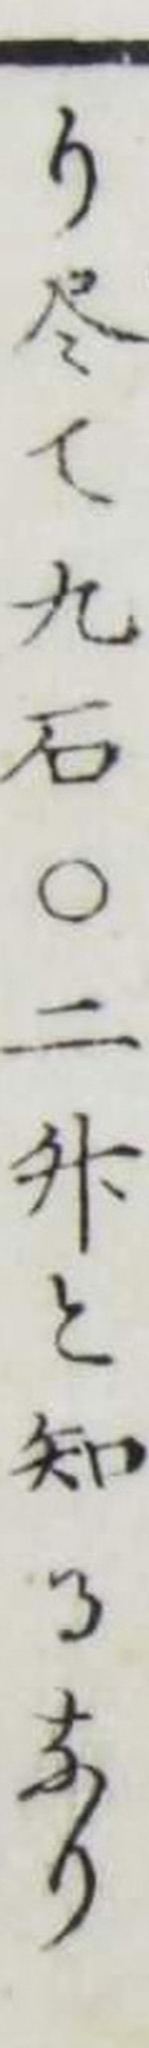り尽て九石〇二升と知るなり
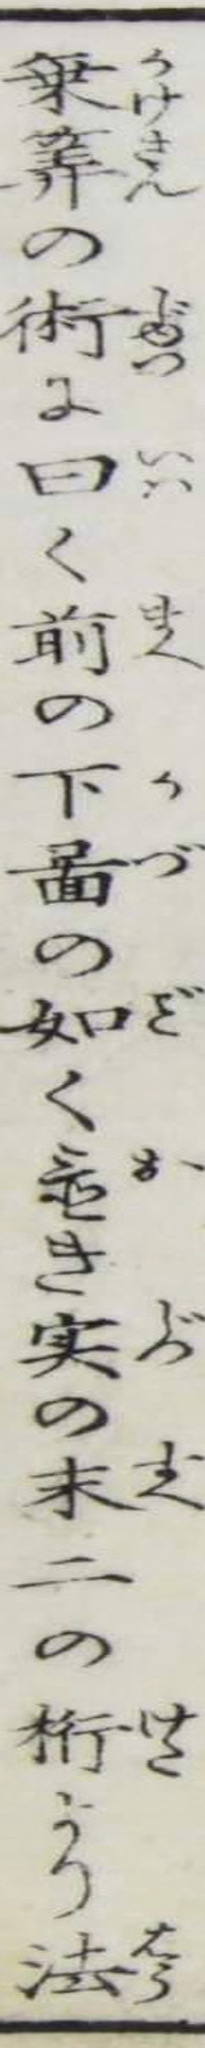乗算の術に曰く前の下図の如く置き実の末二の桁より法

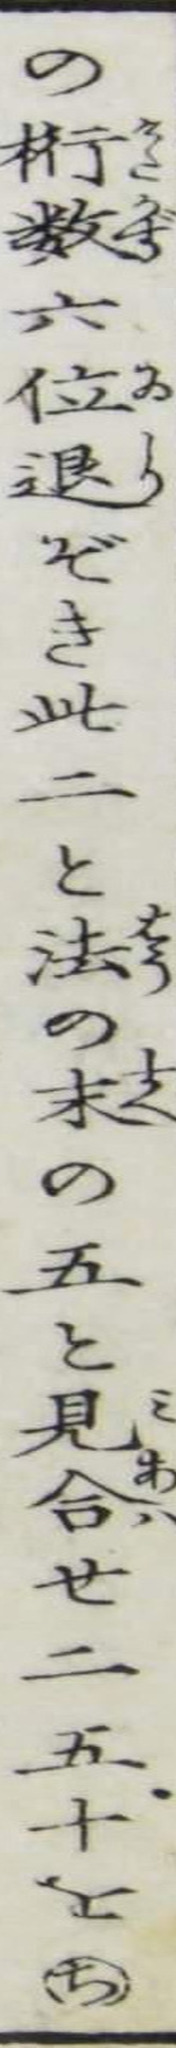の桁数六位退ぞき此二と法の末の五と見合せ二五．十を㋠
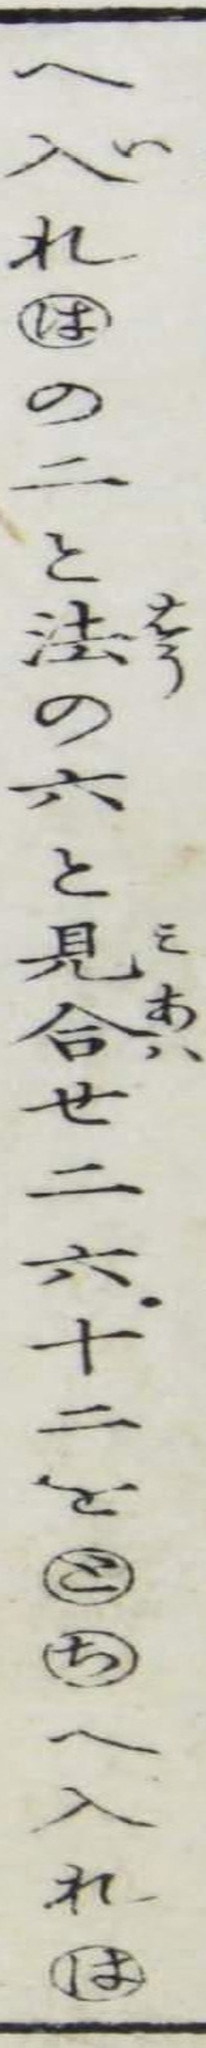へ入れ㋩の二と法の六と見合せ二六．十二を㋣㋠へ入れ㋩
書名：明治小學塵劫記 卷1
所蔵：東京学芸大学教育コンテンツアーカイブ
